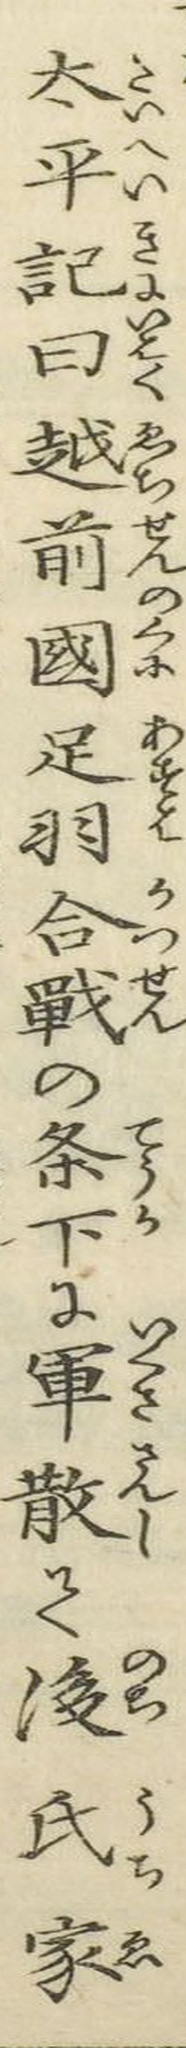太平記曰越前國足羽合戦の条下に軍散て後氏家
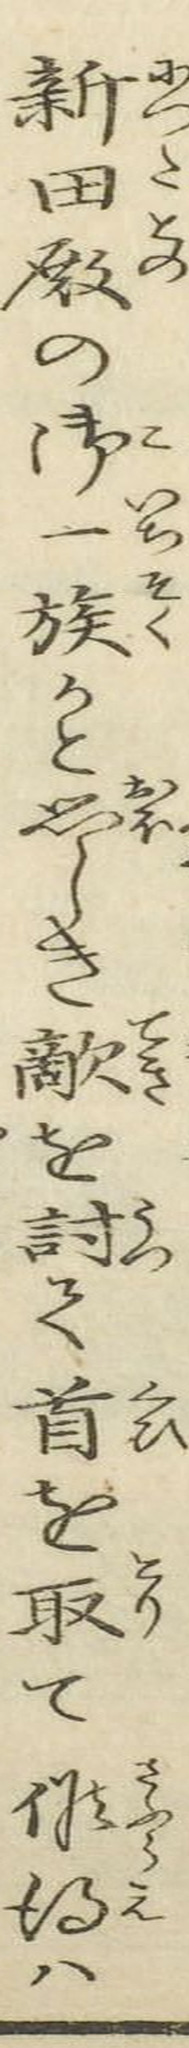新田殿の御一族かと思しき敵を討て首を取て候得は
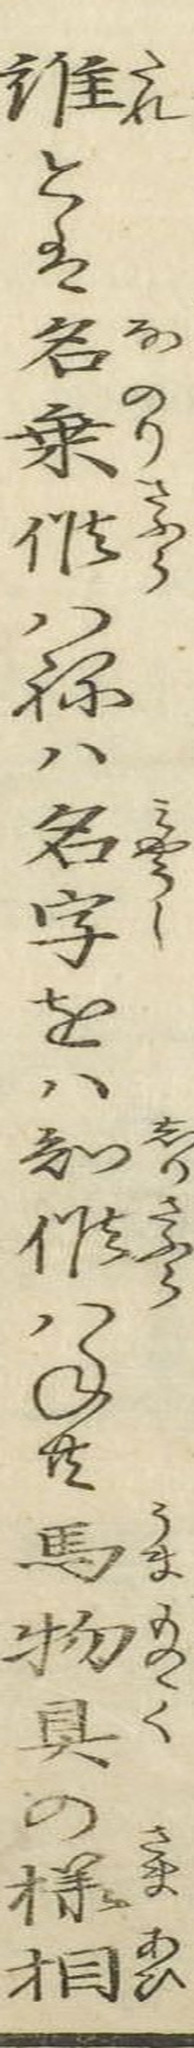誰とは名乗候はねは名字をは知候はね共馬物具の様相
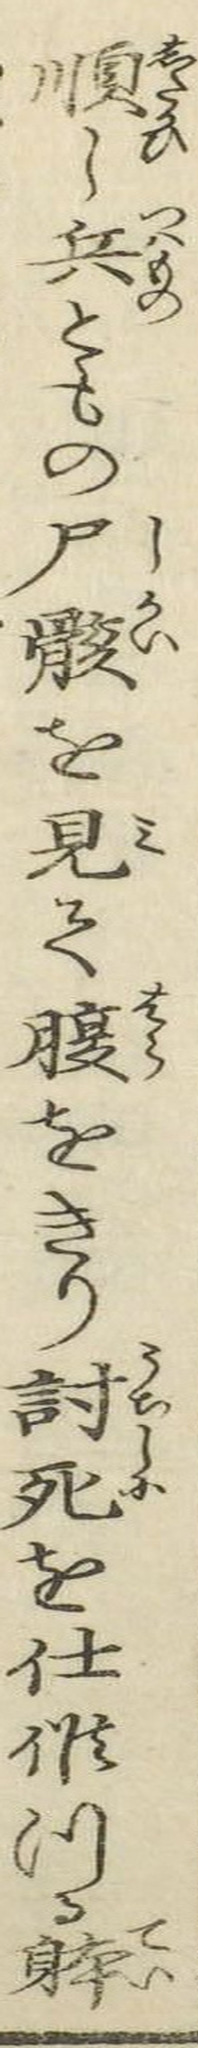順し兵ともの尸骸を見て腹をきり討死を仕候つる躰
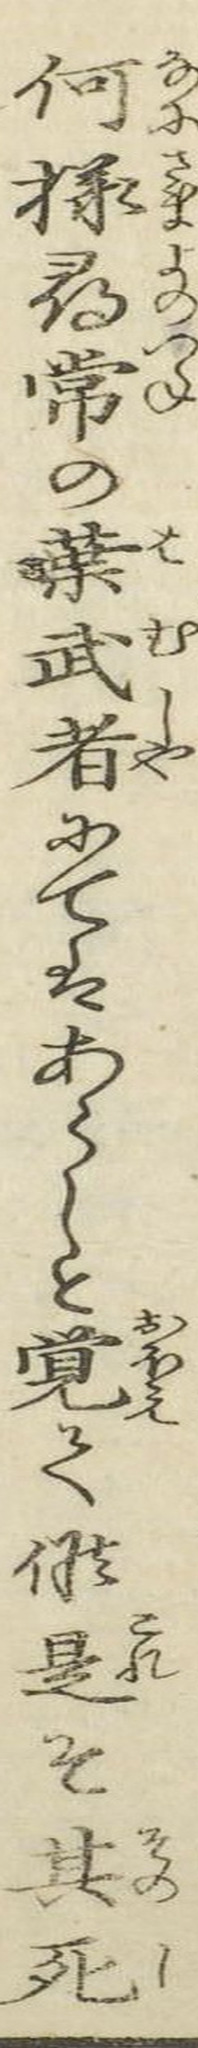何様尋常の葉武者にてはあらしと覚て候是そ其死
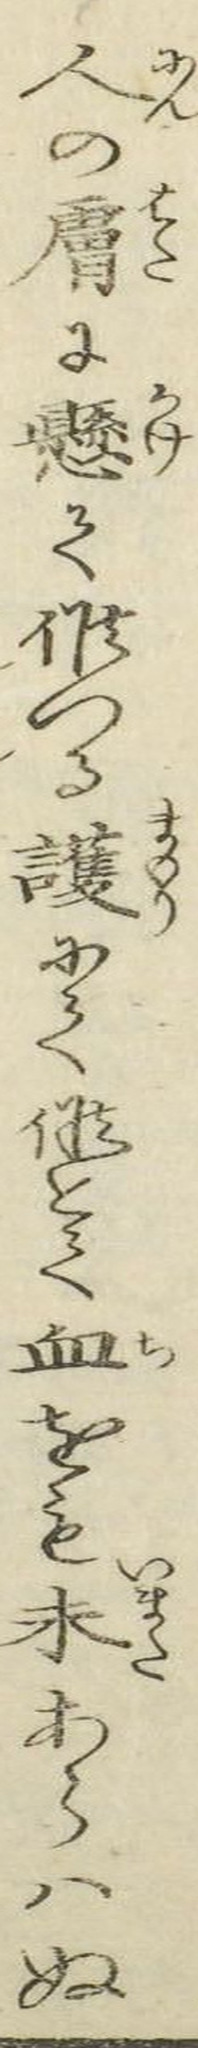人の膚に懸て候つる護にて候とて血をも未あらはぬ
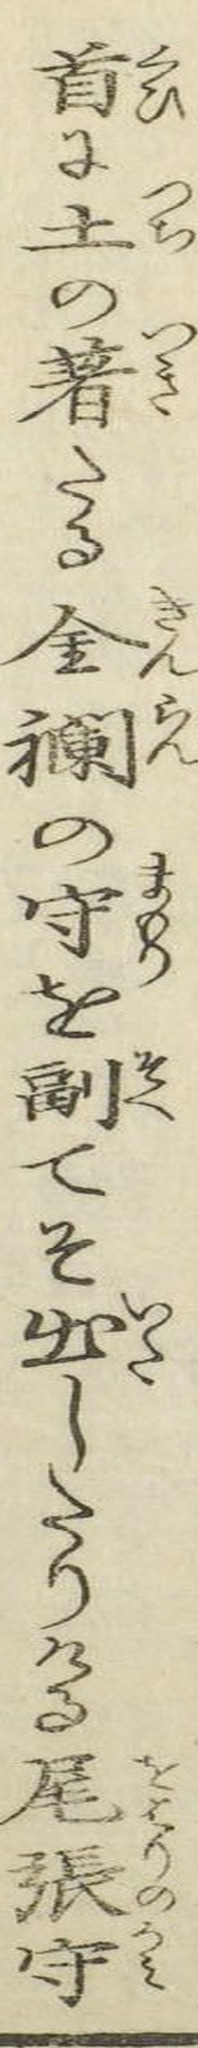首に土の著たる金襴の守を副てそ出したりける尾張守
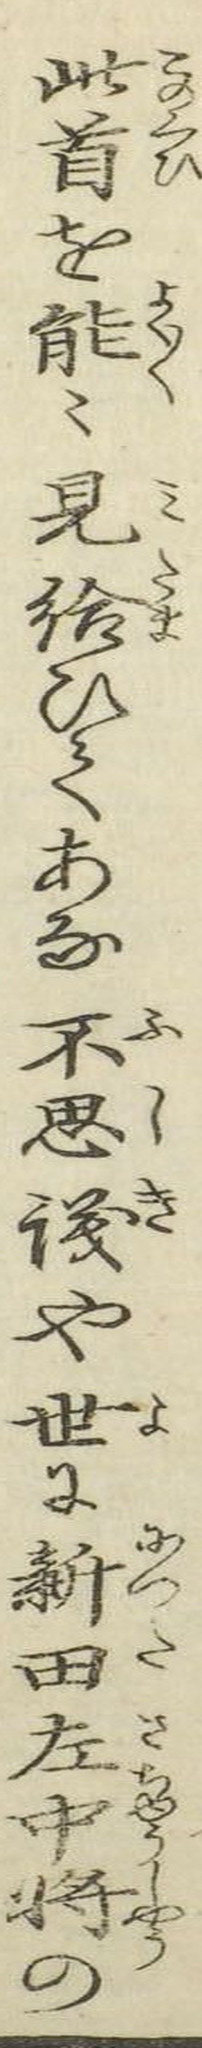此首を能々見給ひてあな不思議や世に新田左中将の
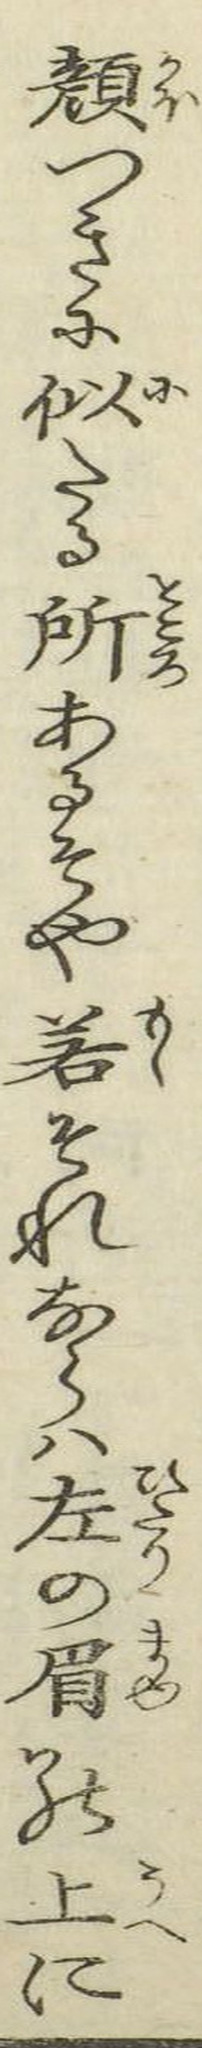顔つきに似たる所あるそや若それならは左の眉の上に
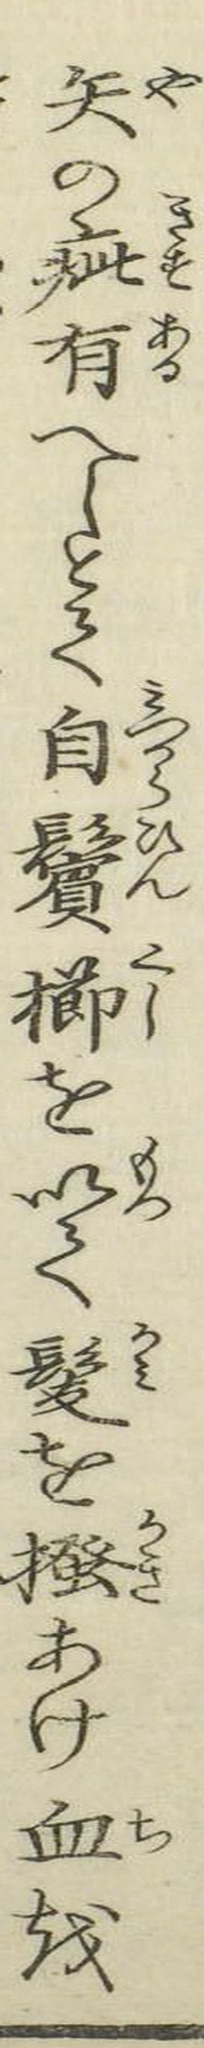矢の疵有へしとて自鬢櫛を以て髪を掻あけ血を
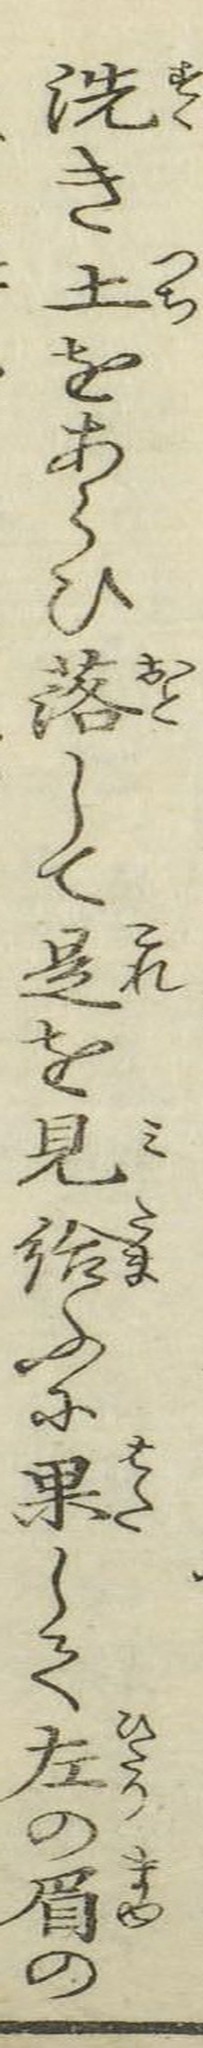洗き土をあらひ落して是を見給ふに果して左の眉の
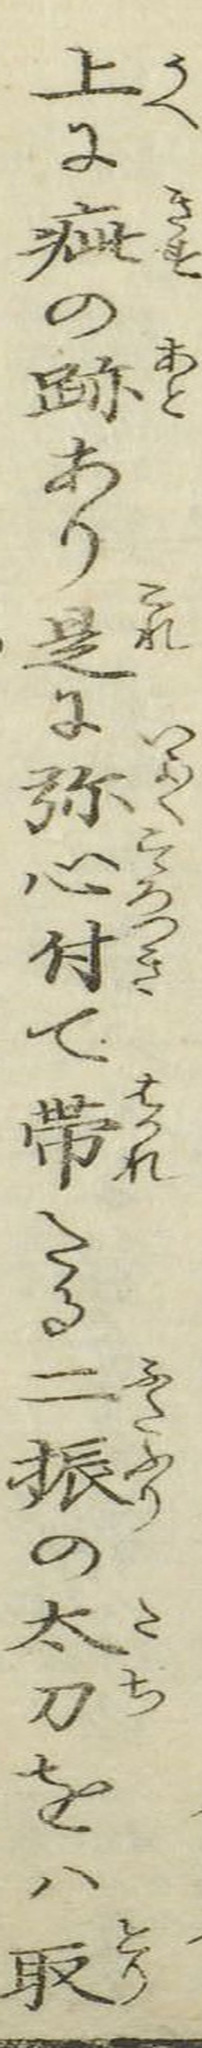上に疵の跡あり是に弥心付て帯たる二振の太刀をは取
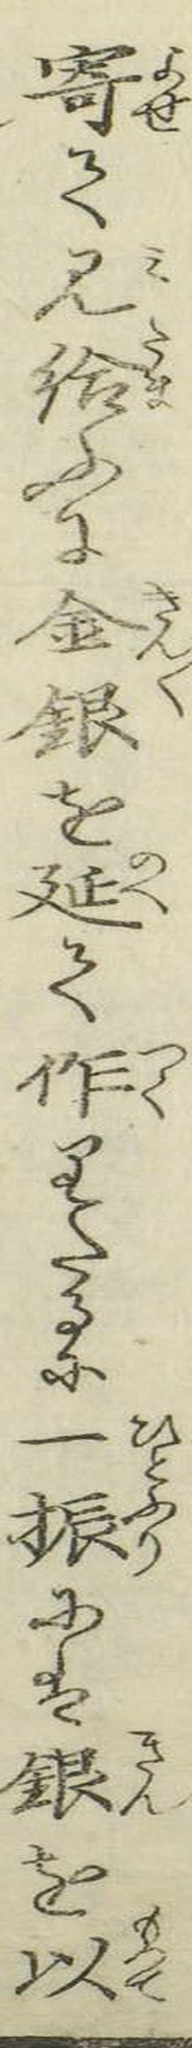寄て見給ふに金銀を延て作りたるに一振には銀を以
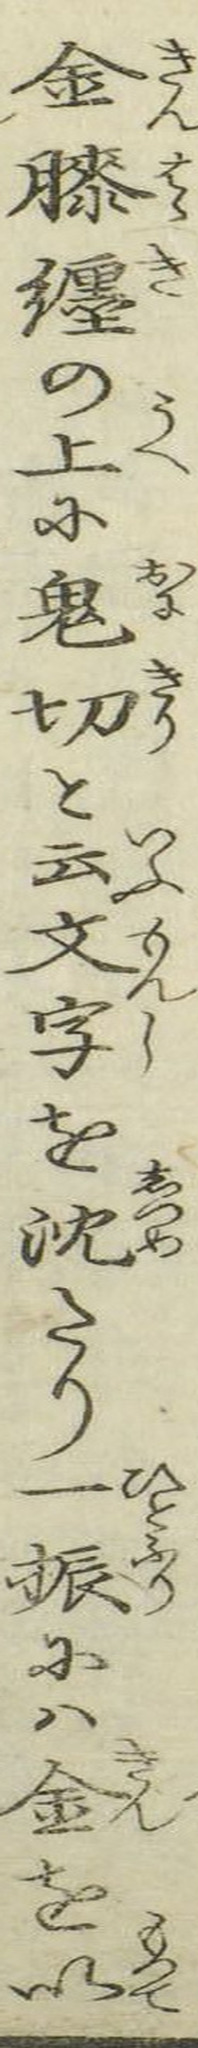金膝纏の上に鬼切と云文字を沈たり一振には金を以
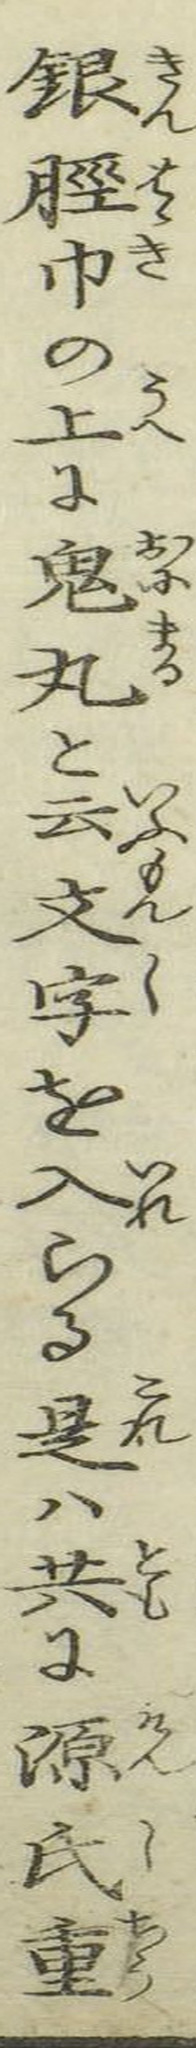銀脛巾の上に鬼丸と云文字を入らる是は共に源氏重
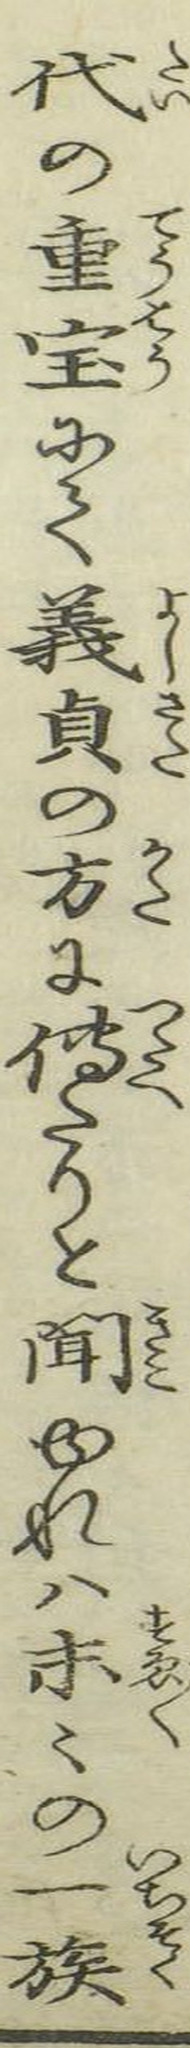代の重宝にて義貞の方に傳たりと聞ゆれは末々の一族
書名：江戸名所図会 20巻 巻之5
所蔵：東京学芸大学教育コンテンツアーカイブ
